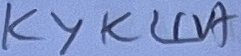кукша
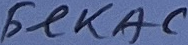бекас
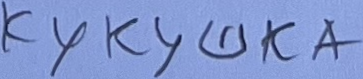кукушка
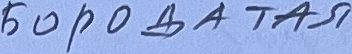бородатая
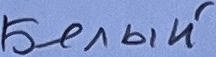белый
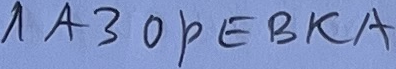лазоревка
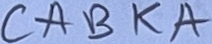савка
